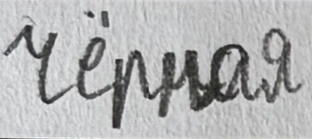чёрная
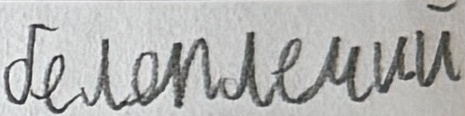белоплечий
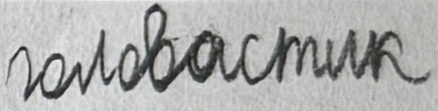головастик
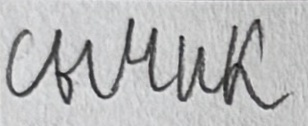сычик
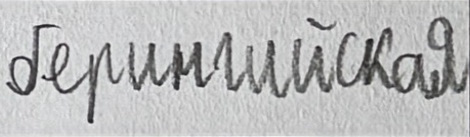берингийская
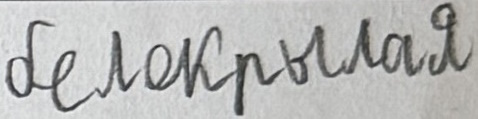белокрылая
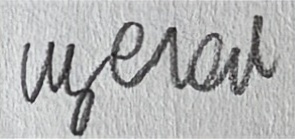щегол
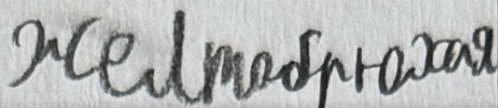желтобрюхая
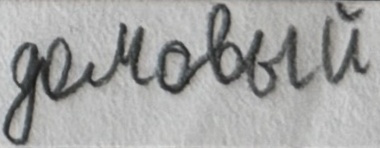домовый
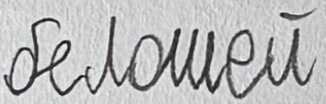белошей
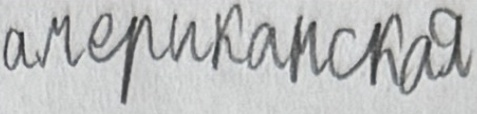американская
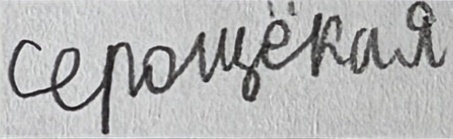серощёкая
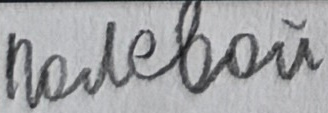полевой
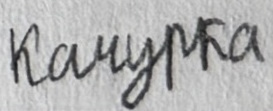качурка
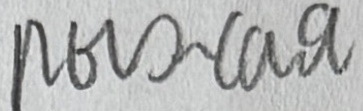рыжая
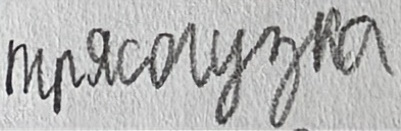трясогузка
